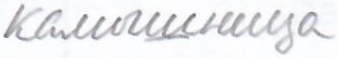камышница
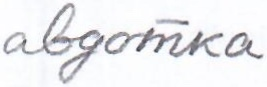авдотка
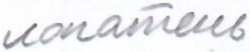лопатень
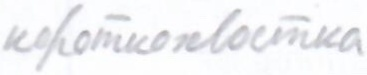короткохвостка
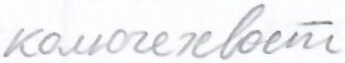колючехвост
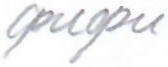фифи
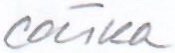сойка
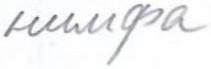нимфа
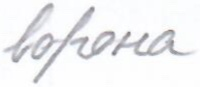ворона
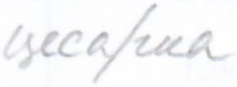цесарка
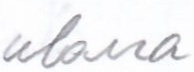иволга
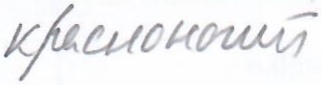красноногий
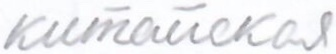китайская
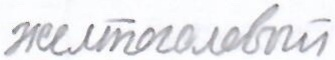желтоголовый
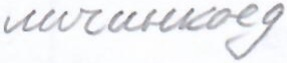личинкоед
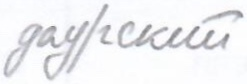даурский
